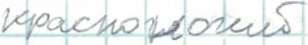красноногий
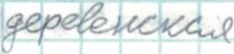деревенская
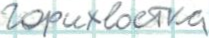горихвостка
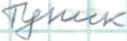тупик
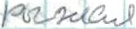рыжая
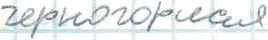черногорлая
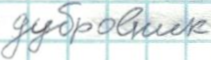дубровник
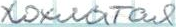хохлатая
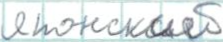японский
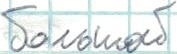большой
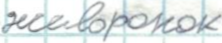жаворонок
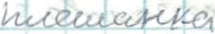плешанка
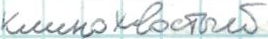клинохвостый
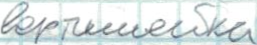вертишейка
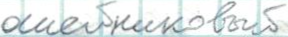ошейниковый
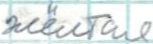жёлтая
